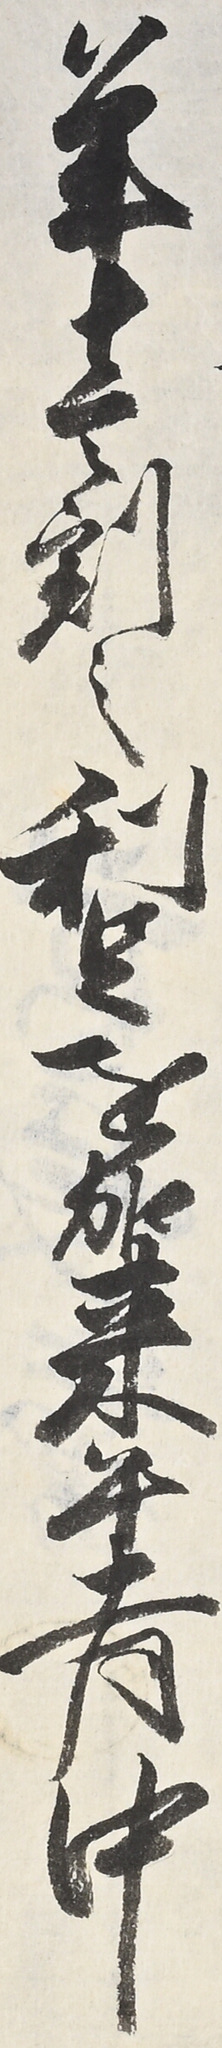年壱割之利足を加来午十一月中
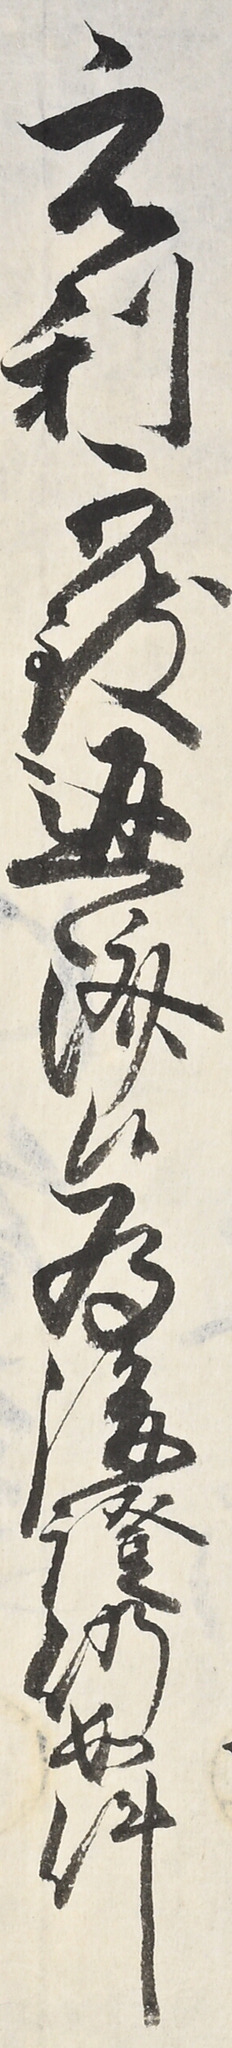元利可致返済候為後證仍如件
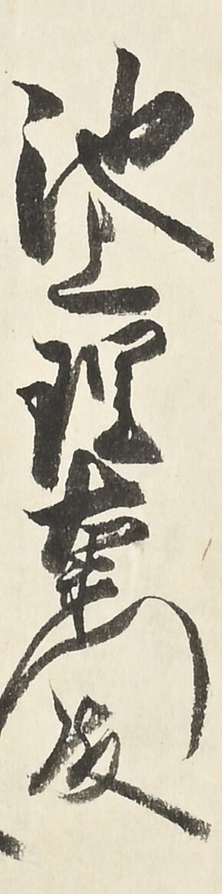池上理右衛門殿
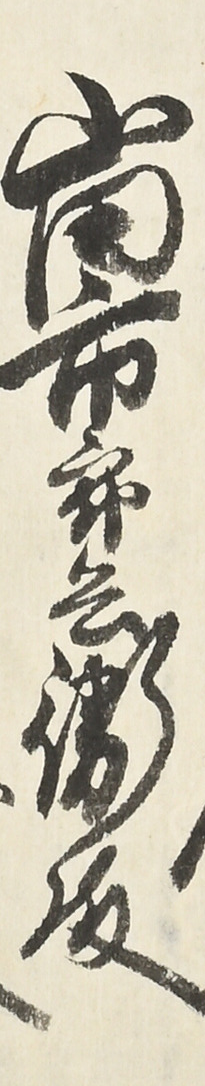山田市郎兵衛殿
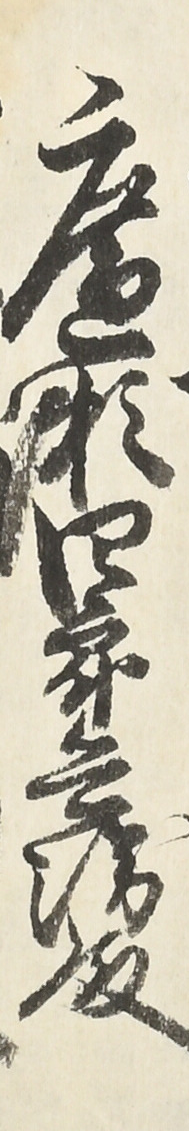廣瀬四郎兵衛殿
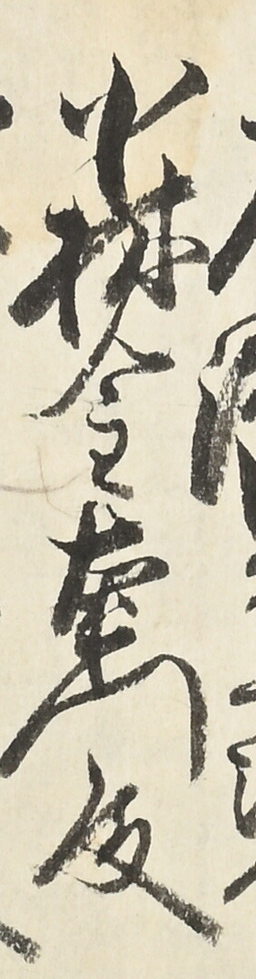小林金右衛門殿
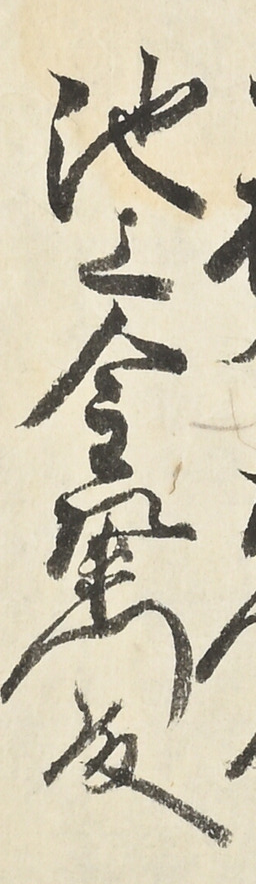池上金左衛門殿

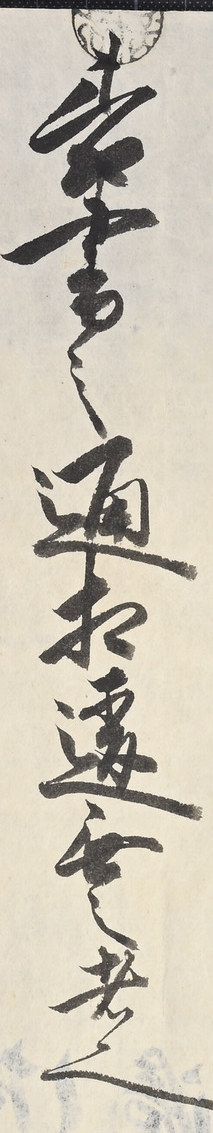表書之通相違無之者也
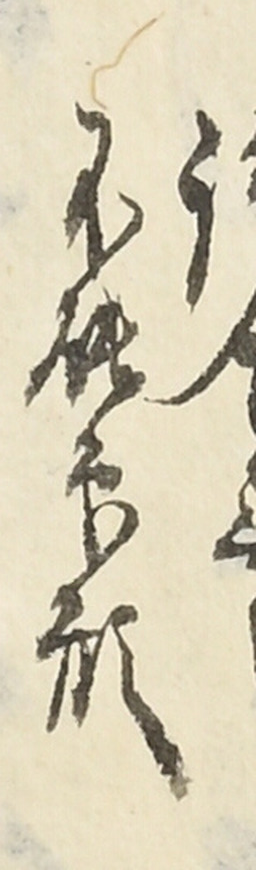不能印形
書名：覚
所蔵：伊那市立高遠町図書館・合同会社AMANE
